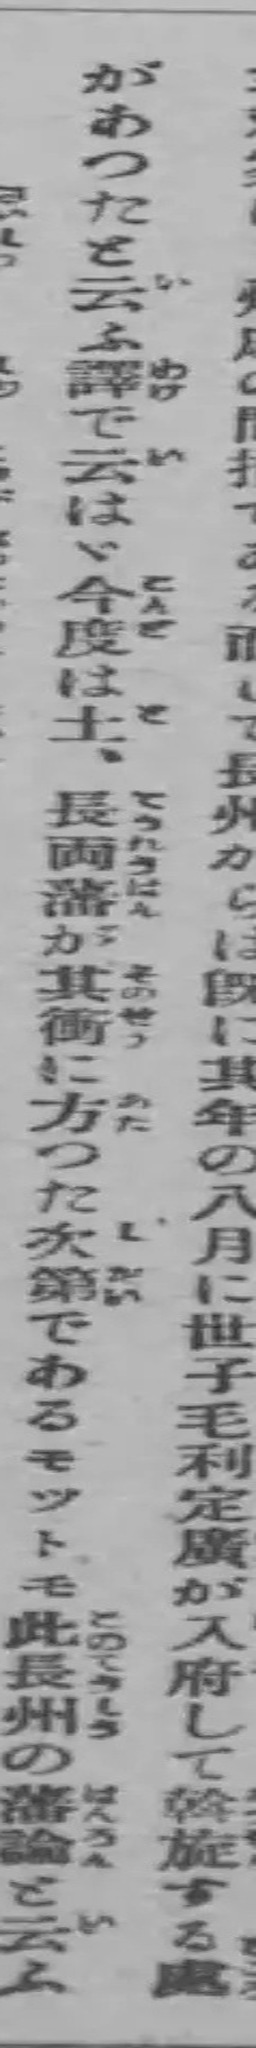があつたと云ふ訳で云はゞ今度は土、長両藩が其衝に方つた次第であるモツトモ此長州の藩論と云ふ
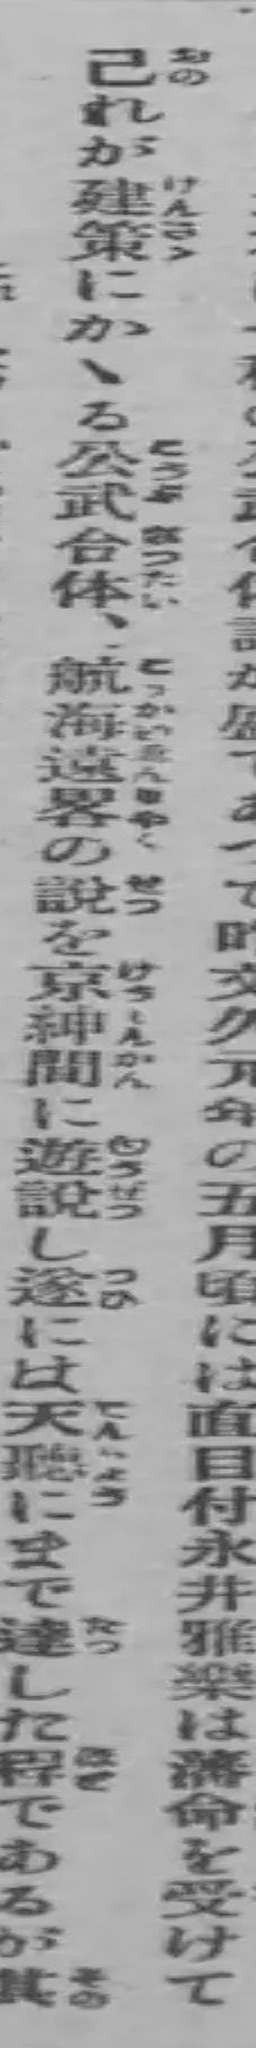己れが建策にかゝる公武合体、航海遠略の説を京神間に遊説し遂には天聴にまで達した程であるが其
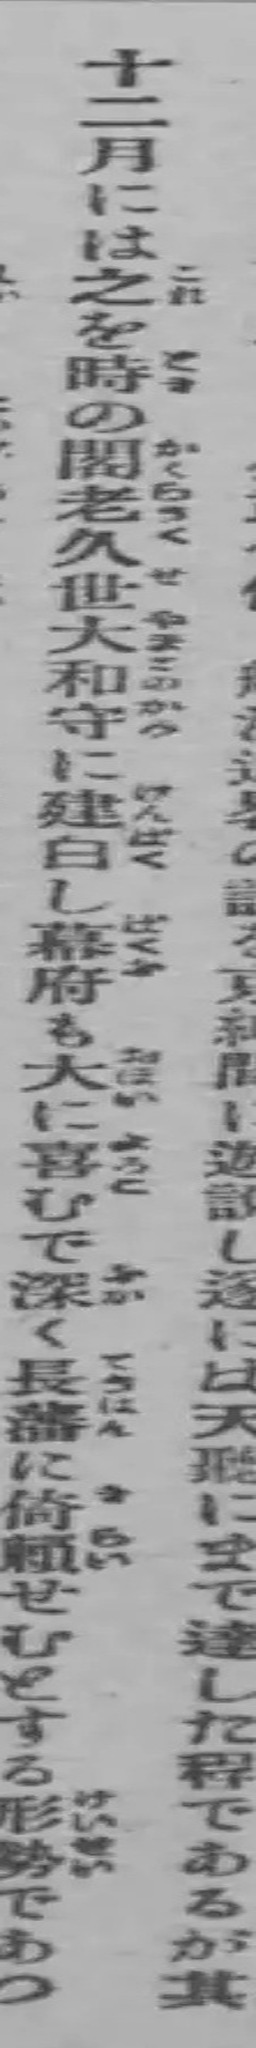十二月には之を時の閣老久世大和守に建白し幕府も大に喜むで深く長藩に倚頼せむとする形勢であつ
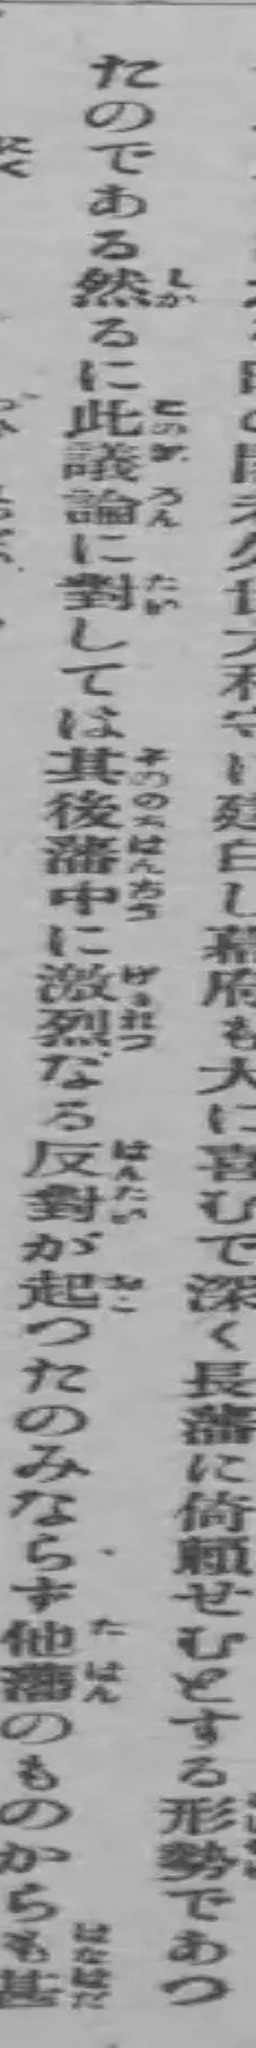たのである然るに此議論に対しては其後藩中に激烈なる反対が起つたのみならず他藩のものからも甚
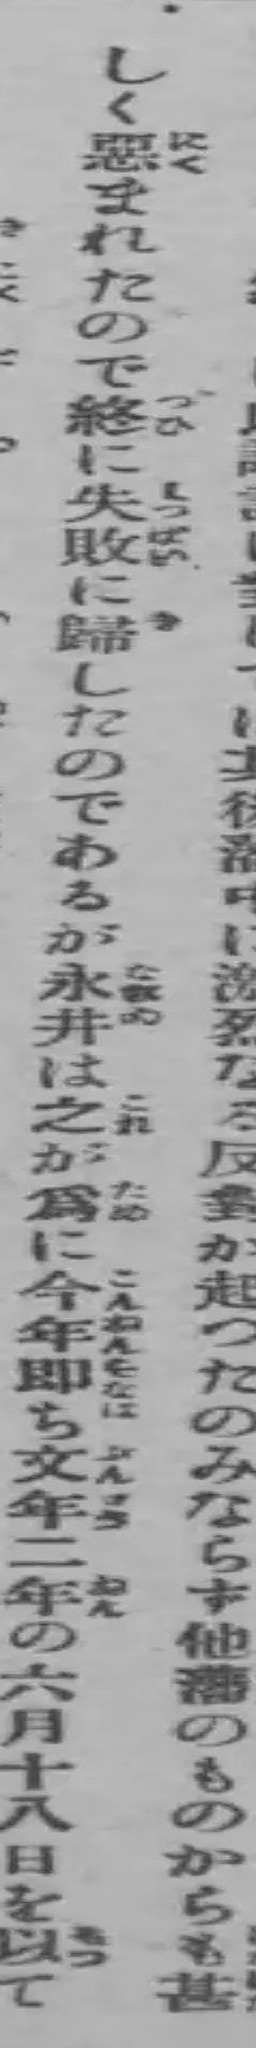しく悪まれたので終に失敗に帰したのであるが永井は之が為に今年即ち文久二年の六月十八日を以て
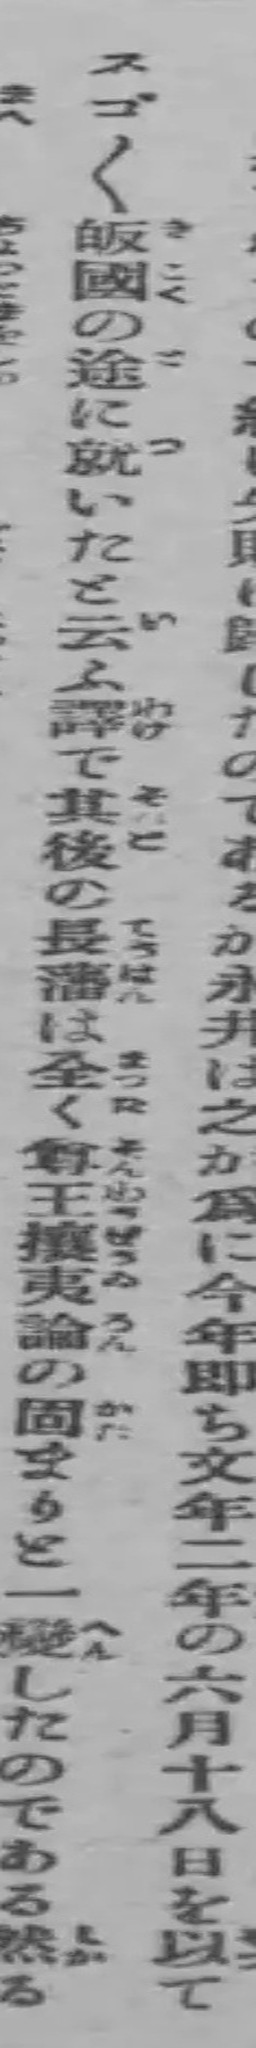スゴ〳〵皈国の途に就いたと云ふ訳で其後の長藩は全く尊王攘夷論の固まりと一変したのである然る
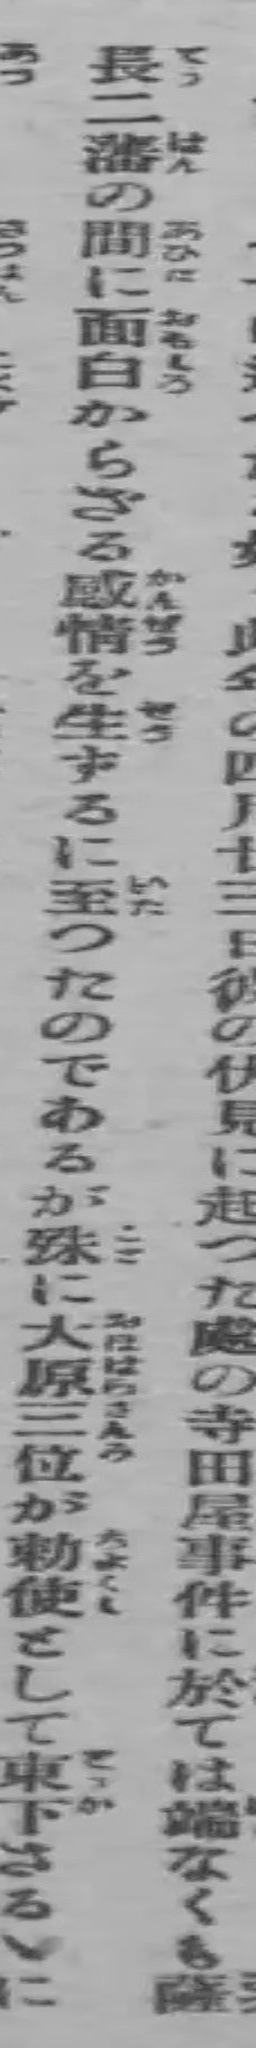長二藩の間に面白からざる感情を生ずるに至つたのであるが殊に大原三位が勅使として東下さるゝに
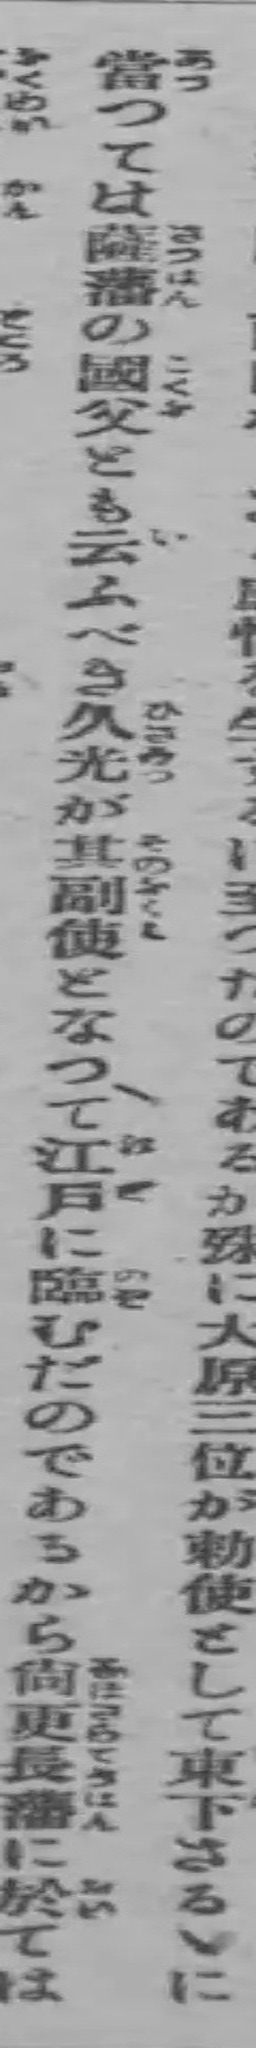当つては薩藩の国父とも云ふべき久光が其副使となつて江戸に臨むだのであるから尚更長藩に於ては
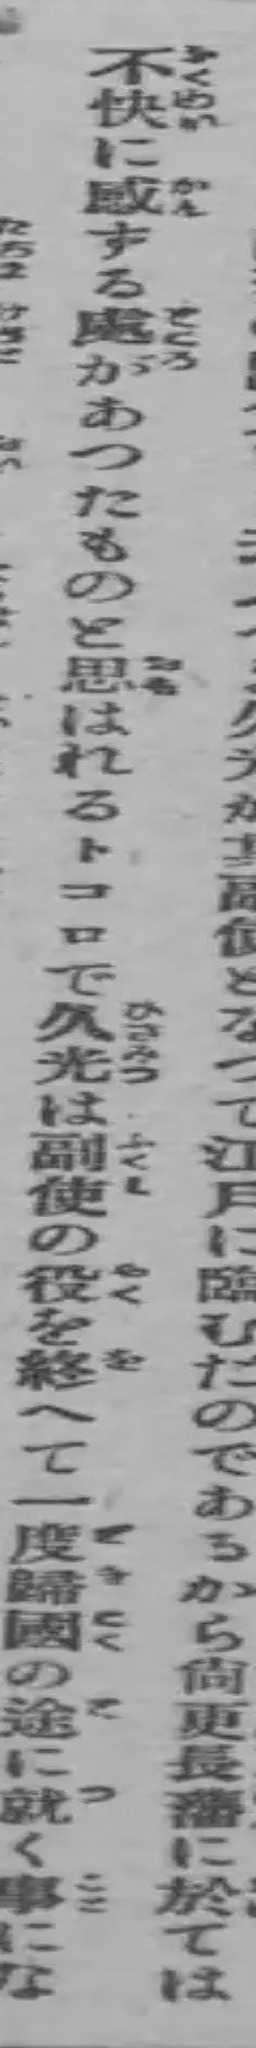不快に感ずる処があつたものと思はれるトコロで久光は副使の役を終へて一度帰国の途に就く事にな
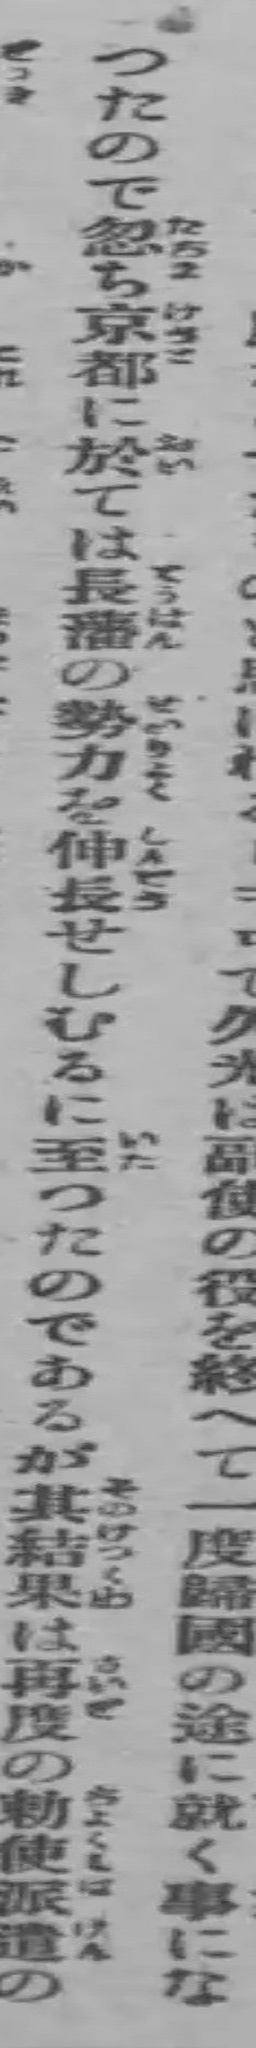つたので忽ち京都に於ては長藩の勢力を伸長せしむるに至つたのであるが其結果は再度の勅使派遣の
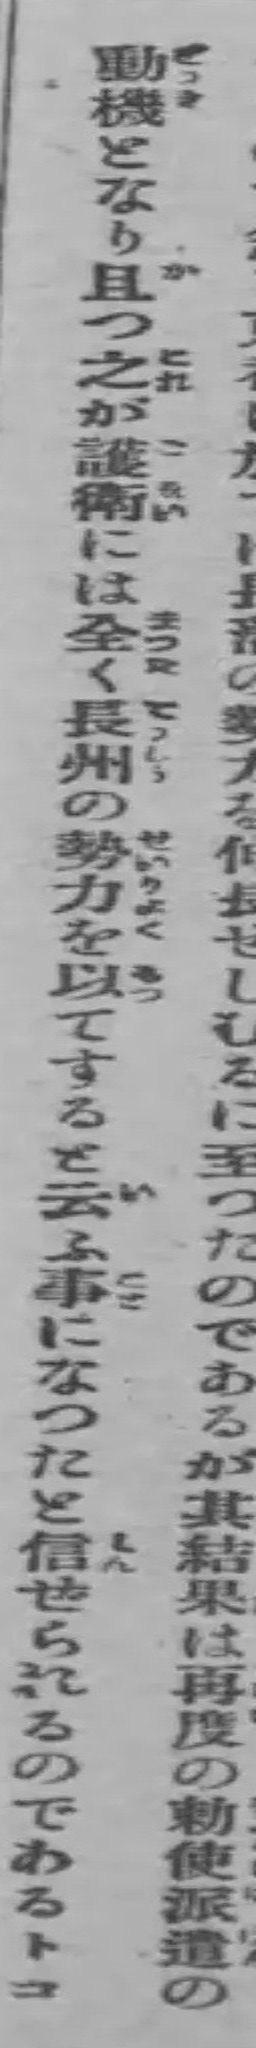動機となり且つ之が護衛には全く長州の勢力を以てすると云ふ事になつたと信ぜられるのであるトコ
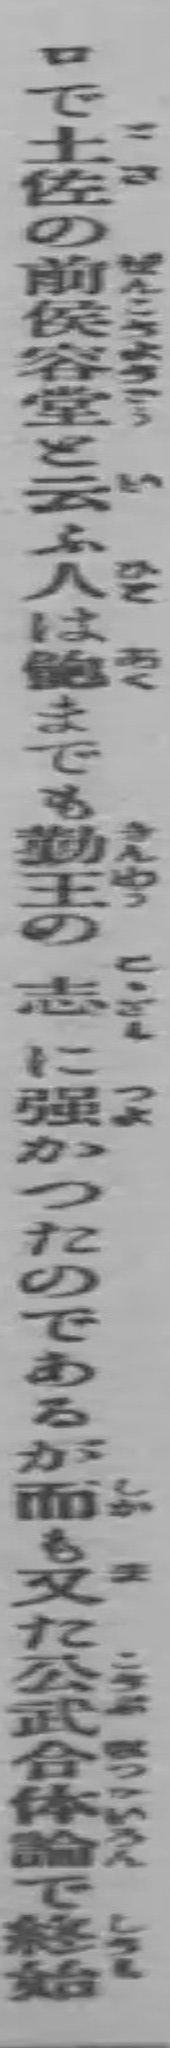ロで土佐の前侯容堂と云ふ人は飽までも勤王の志に強かつたのであるが而も又た公武合体論に終始
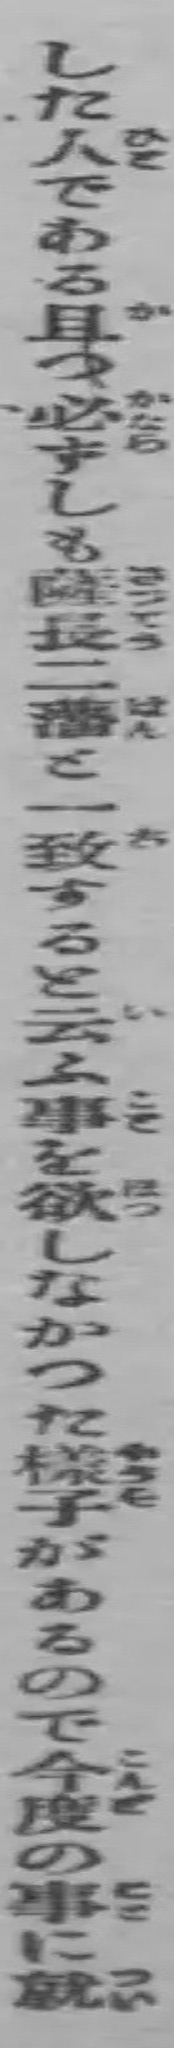した人である且つ必ずしも薩長二藩と一致すると云ふ事を欲しなかつた様子があるので今度の事に就
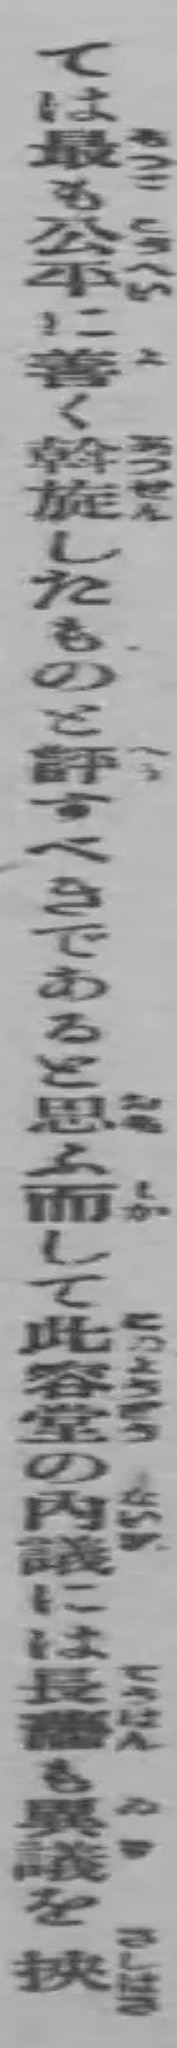ては最も公平に善く斡旋したものと評すべきであると思ふ而して此容堂の内議には長藩も異議を挟
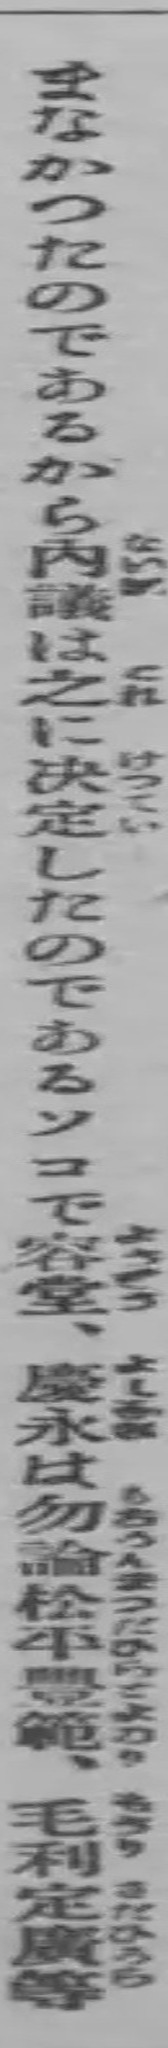まなかつたのであるから内議は之に決定したのであるソコで容堂、慶永は勿論松平豊範、毛利定廣等
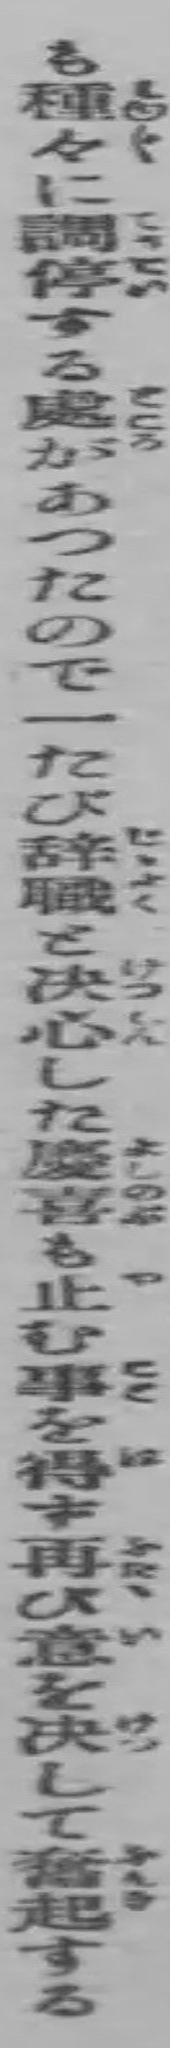も種々に調停する処があつたので一たび辞職と決心した慶喜も止む事を得ず再び意を決して奮起する
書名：豊橋市史談
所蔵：国立国会図書館 National Diet Library, JAPAN
